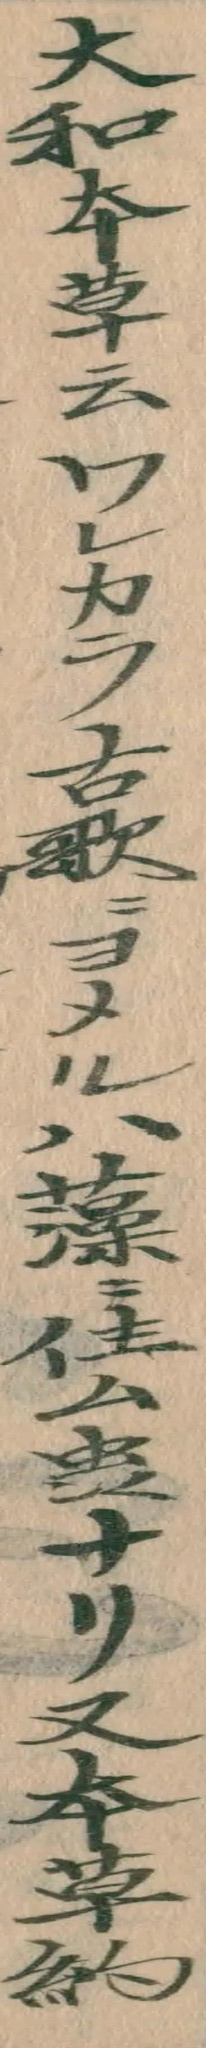大和本草云ワレカラ古歌ニヨメルハ藻ニ住ム蟲ナリ又本草約
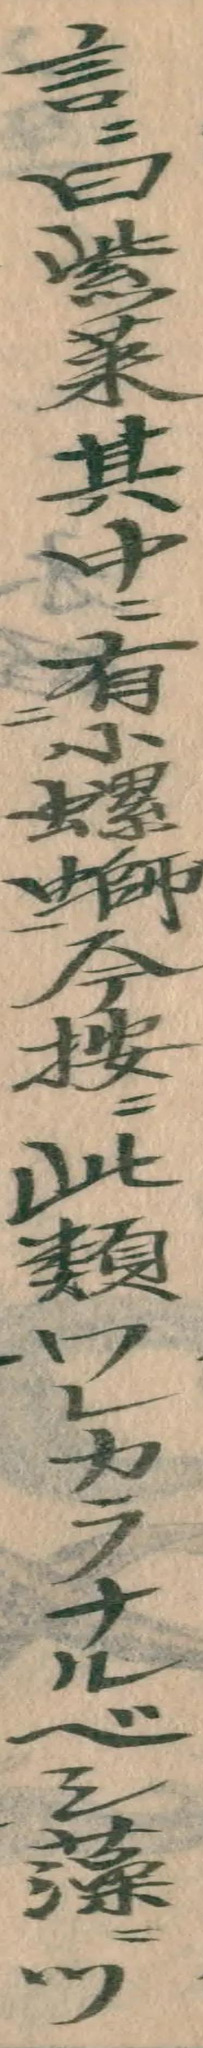言ニ曰紫菜其中ニ有小螺螄今按ニ此類ワレカラナルベシ藻ニツ
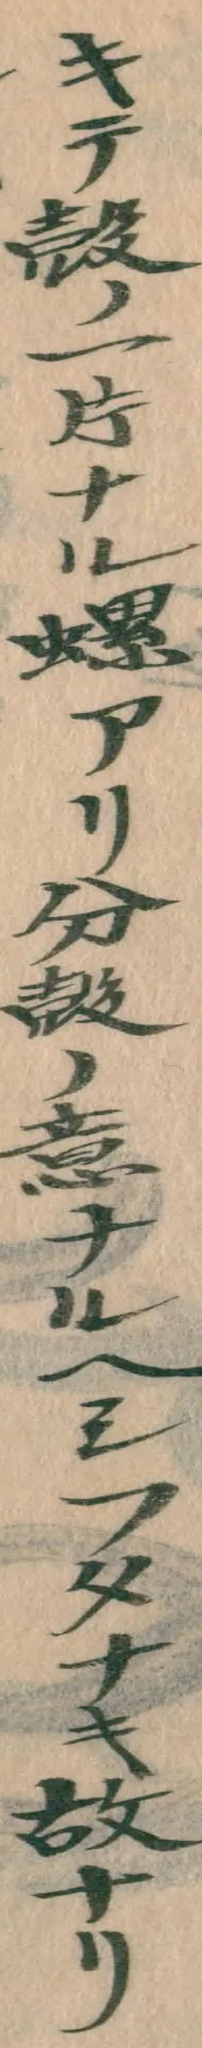キテ殻ノ一片ナル螺アリ分殻ノ意ナルヘシフタナキ故ナリ
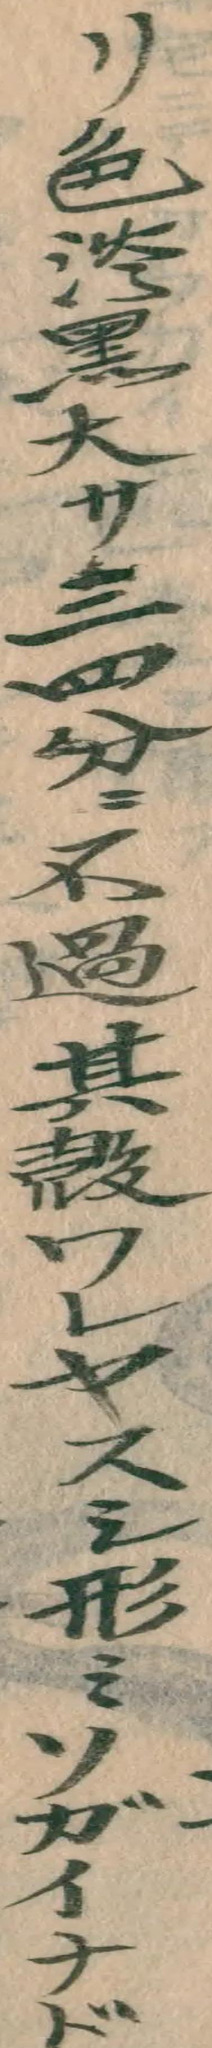リ色淡黒大サ三四分ニ不過其殻ワレヤスシ形ミソガイナド
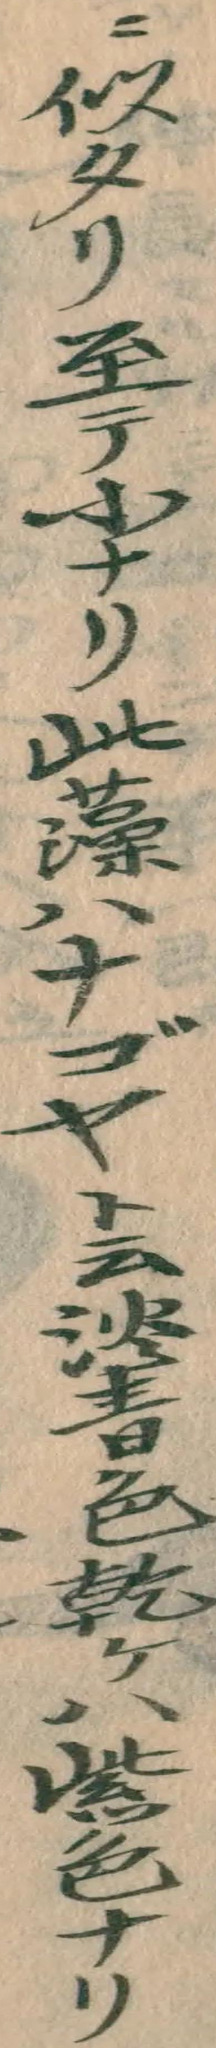ニ似タリ至テ小ナリ此藻ハナゴヤト云淡青色乾ケハ紫色ナリ
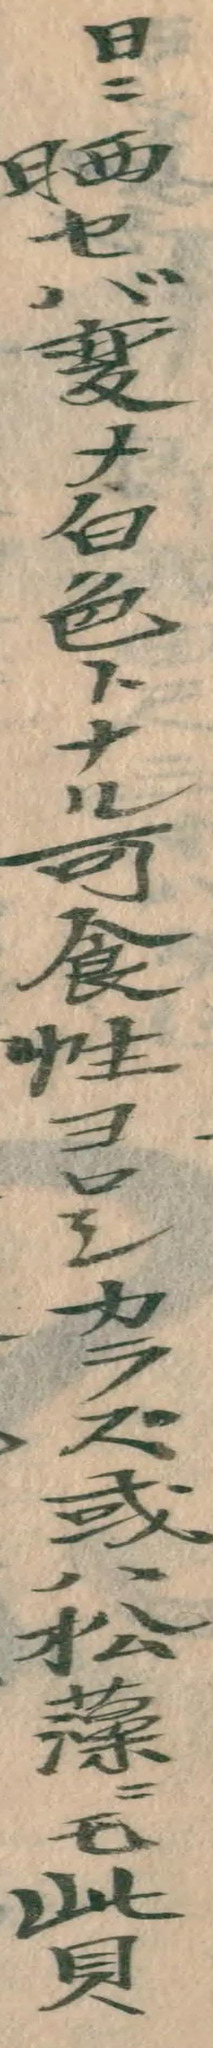日ニ晒セバ変シテ白色トナル可食性ヨロシカラズ或ハ松藻ニモ此貝

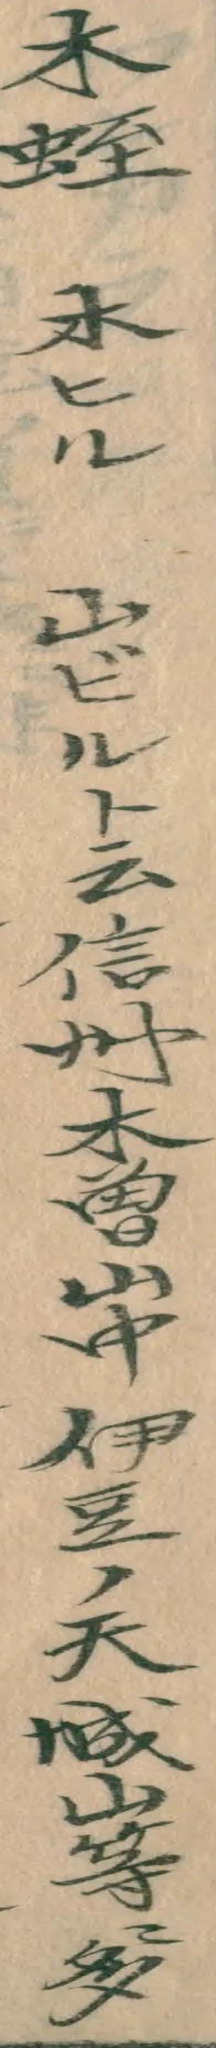木蛭木ヒル山ビルト云信州木曽山中伊豆ノ天城山等ニ多
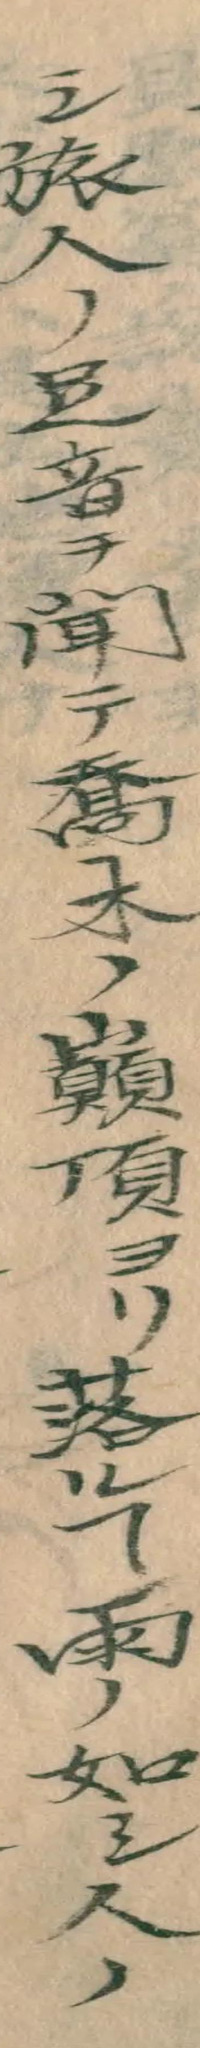シ旅人ノ足音ヲ聞テ喬木ノ巓頂ヨリ落ルコト雨ノ如シ人ノ
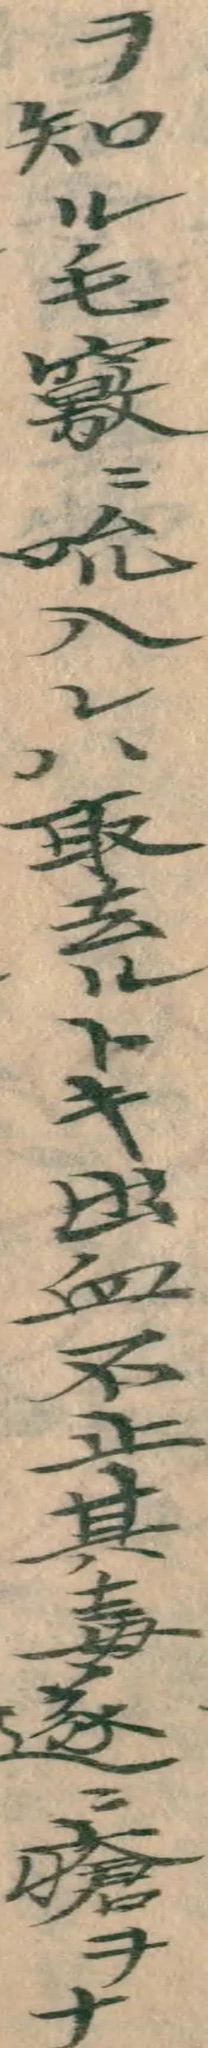ヲ知ル毛竅ニ吮入レハ取去ルトキ出血不止其毒遂ニ瘡ヲナ
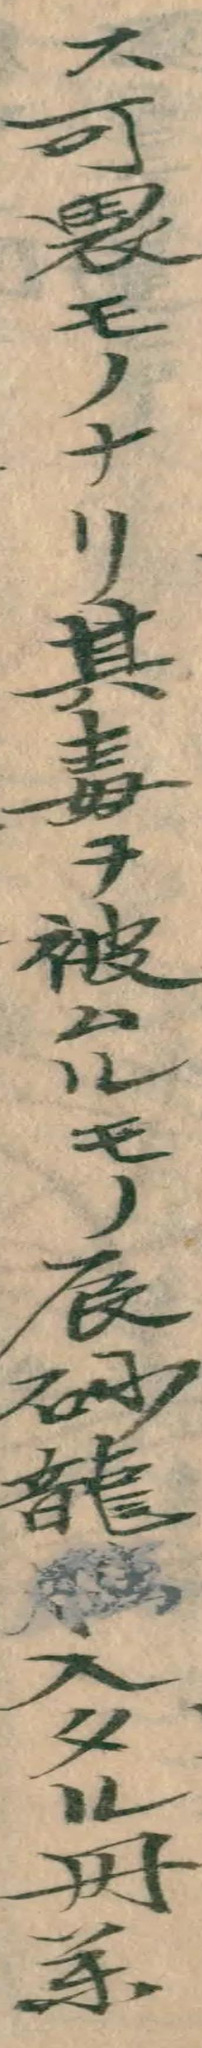ス可畏モノナリ其毒ヲ被ムルモノ辰砂龍入タル丹薬
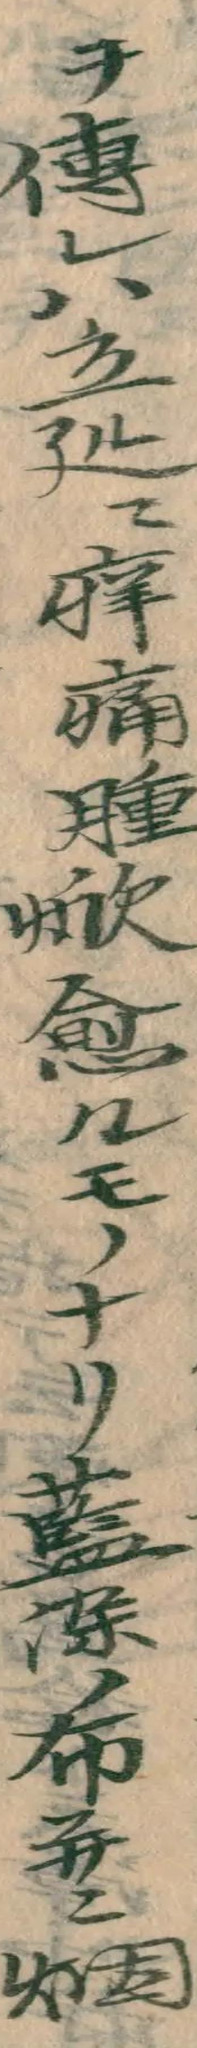ヲ傅レハ立処ニ痒痛腫焮愈ルモノナリ藍深ノ布并ニ烟
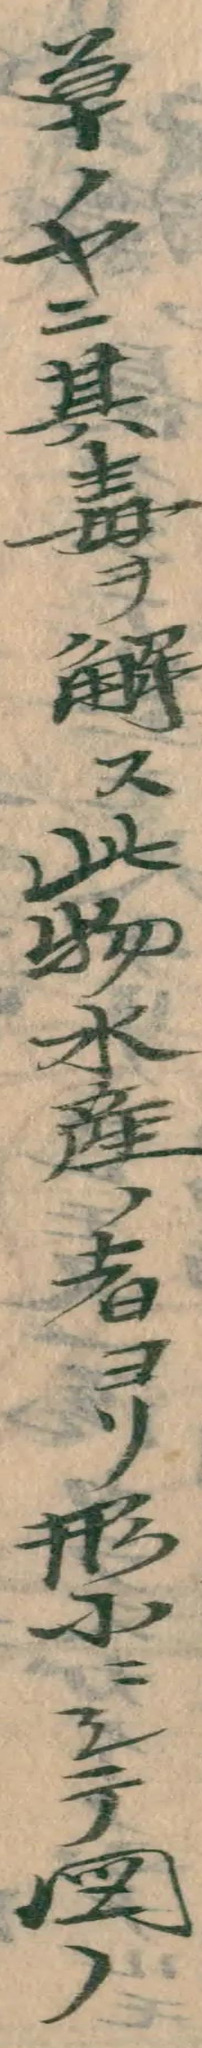草ノヤニ其毒ヲ解ス此物水産ノ者ヨリ形小ニシテ図ノ
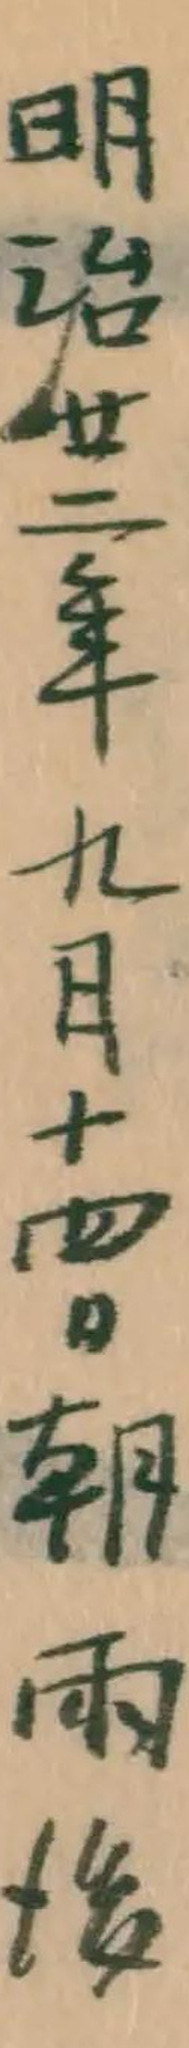明治廿二年九月十四日朝雨後
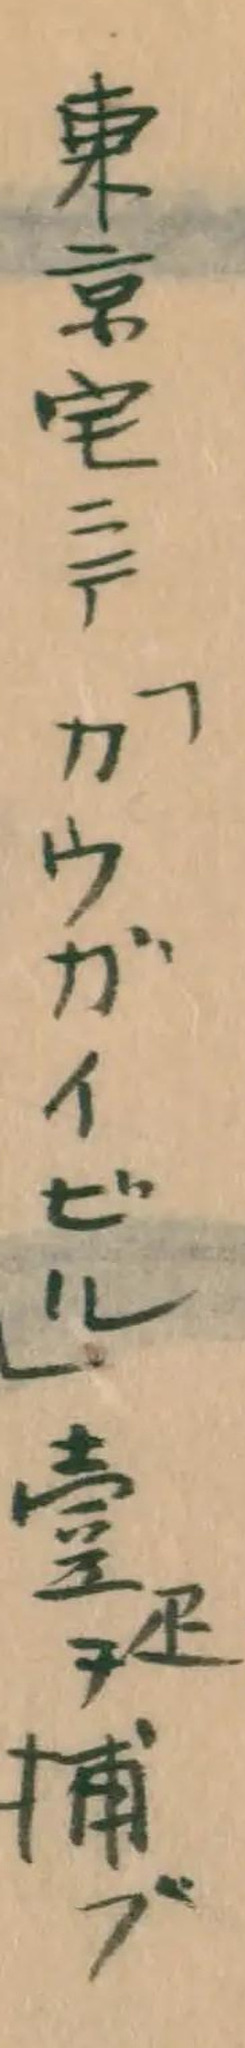東京宅ニテ「カウガイビル」壹疋ヲ捕ブ
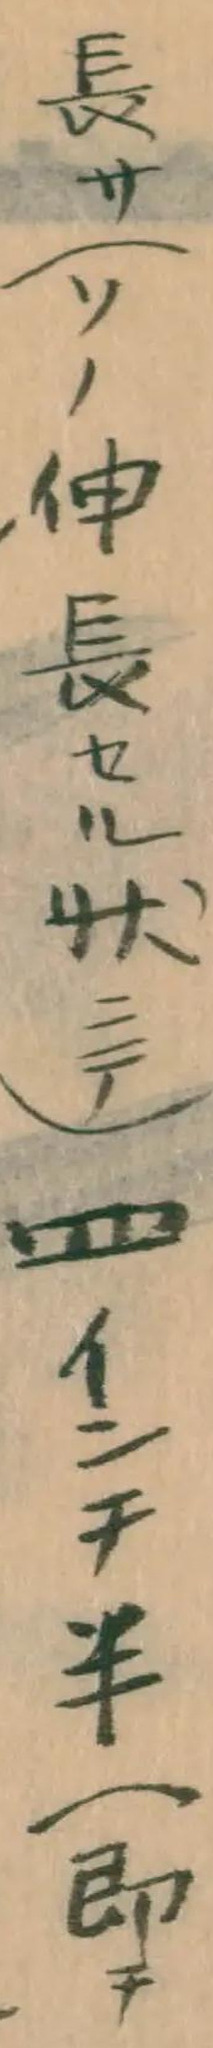長サ(ソノ伸長セル状ニテ)四インチ半(即チ
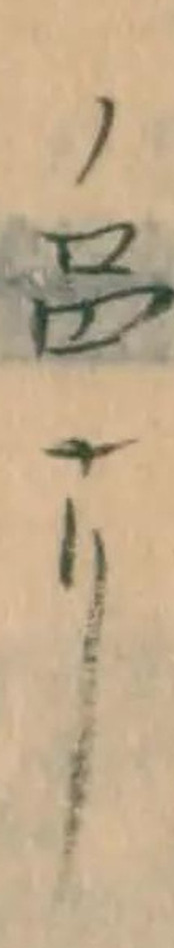ノ品ナリ
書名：千蟲譜 3巻. [1]
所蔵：国立国会図書館 National Diet Library, JAPAN
